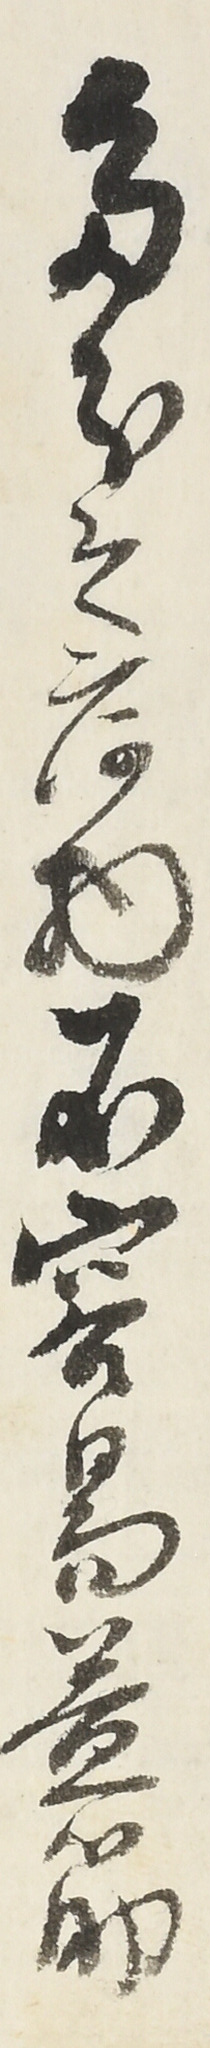多分之荷物不容易益筋
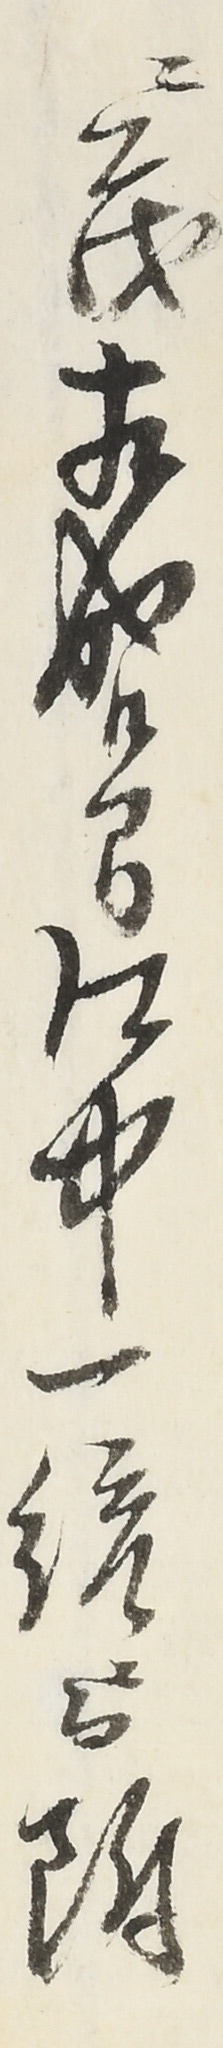にも相成候間郷中一統にて付
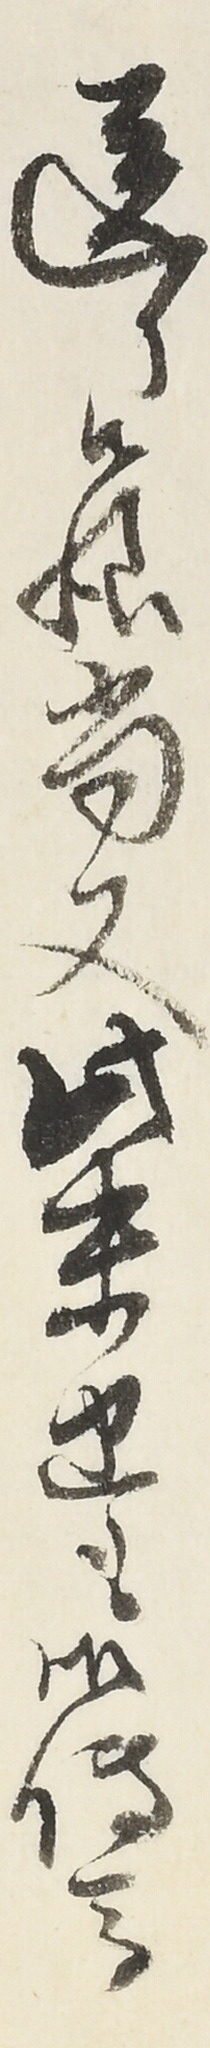送り候様尚又此末迚も御伝馬
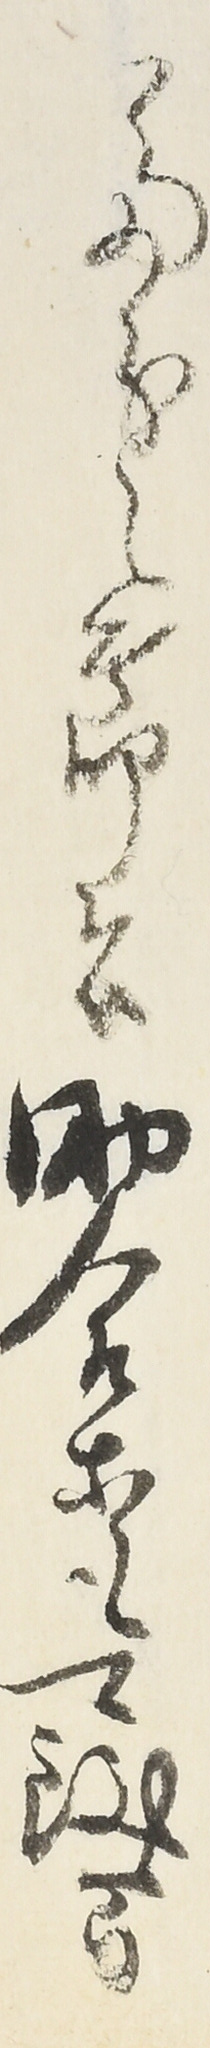多分之節は助合等も可致候間
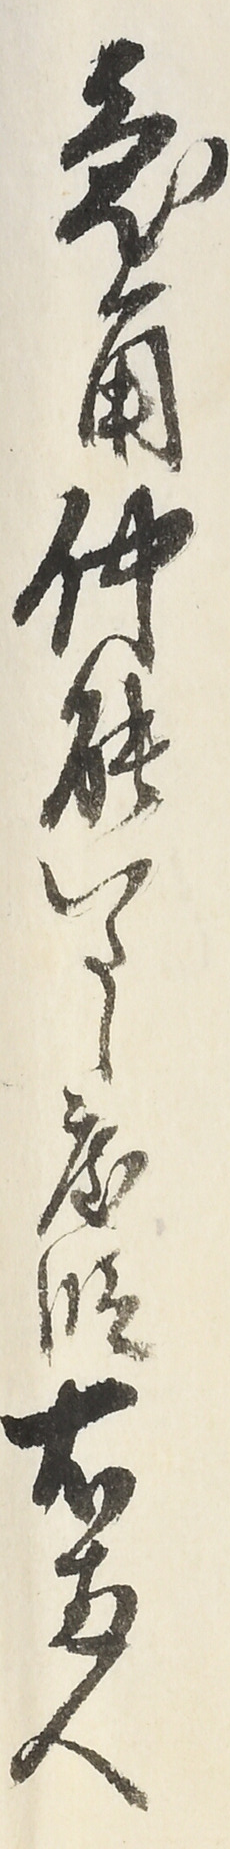兎角仲能いたし度段右両人
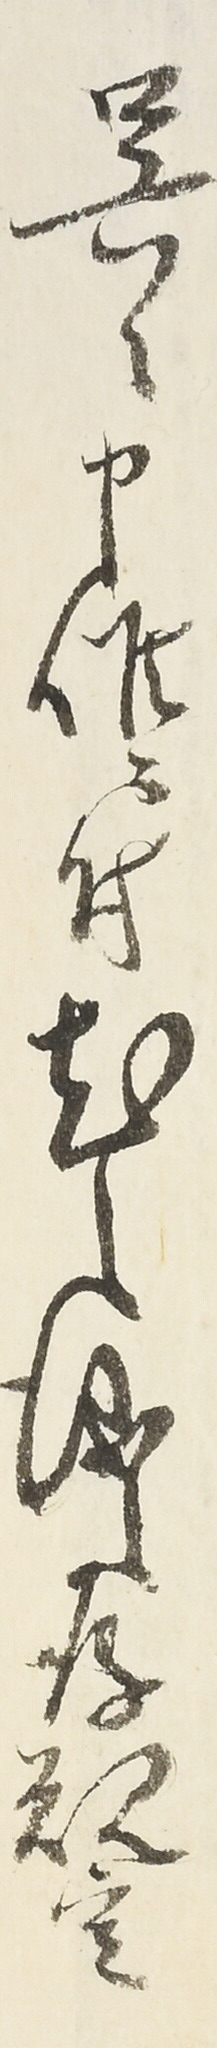呉々申候に付尤之儀に存規定
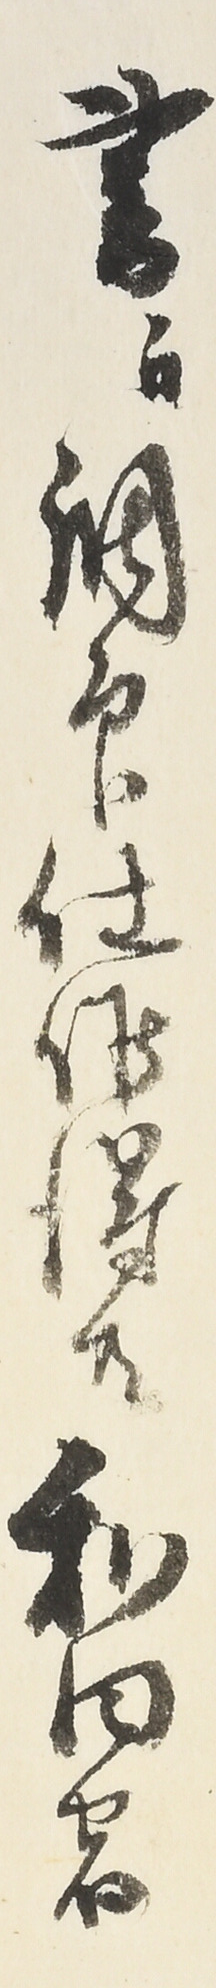書え調印仕候得共和田宿
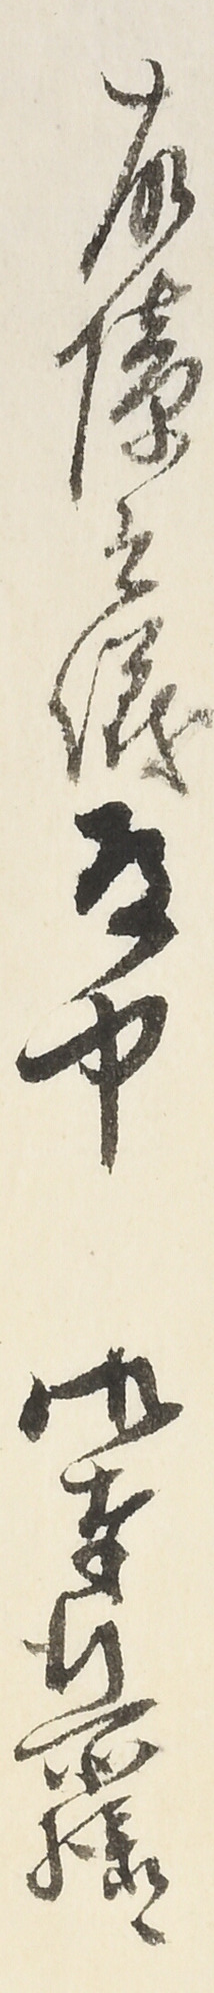故障之儀道中御奉行所様へ
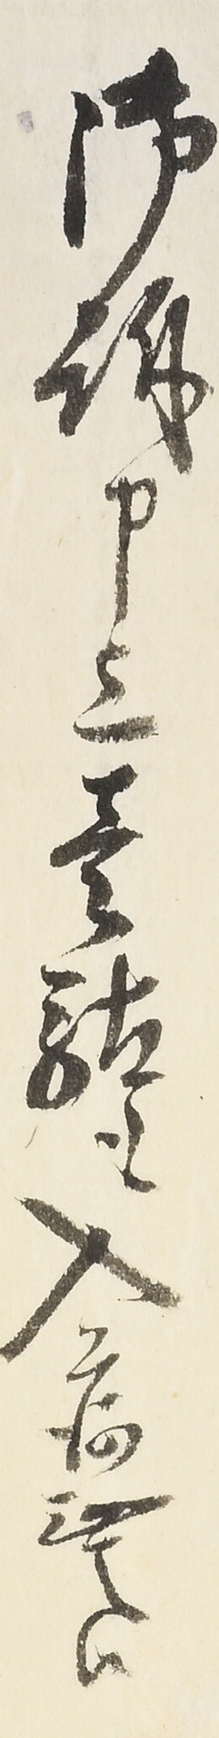御訴申上壱駄も入荷無之候
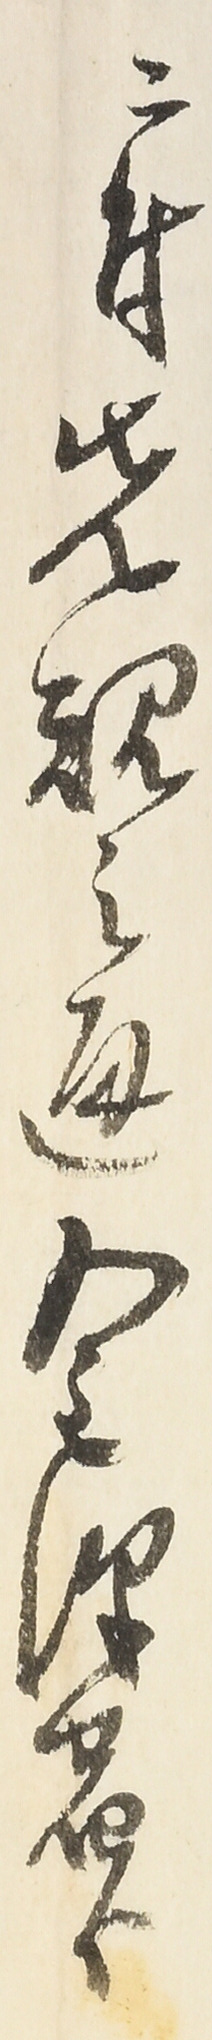に付先規之通金沢宿ゟ
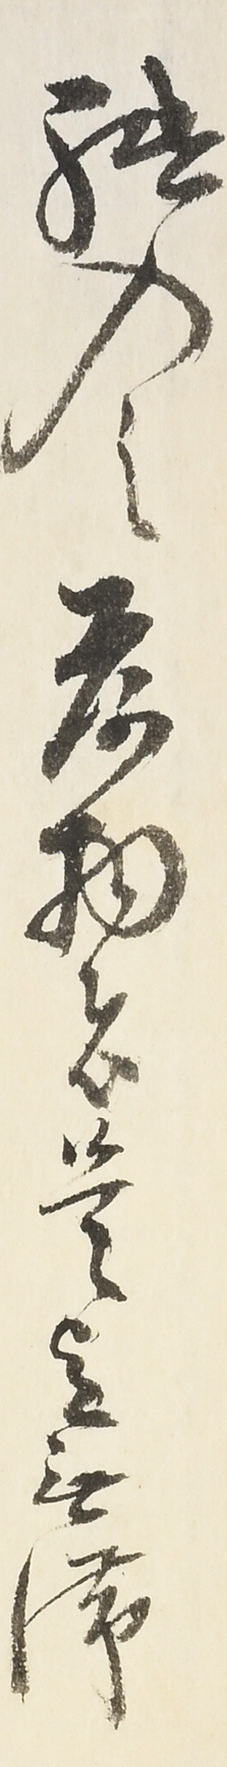継入之荷物は是迄無滞
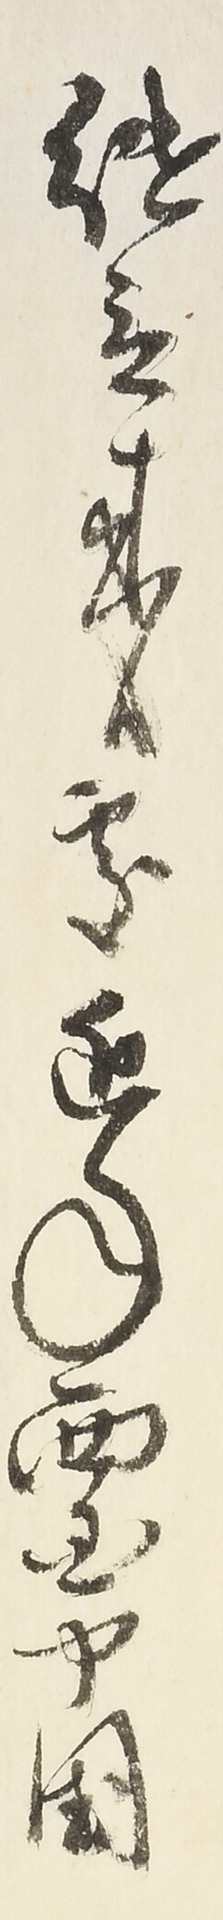継立来候処近年西国中国
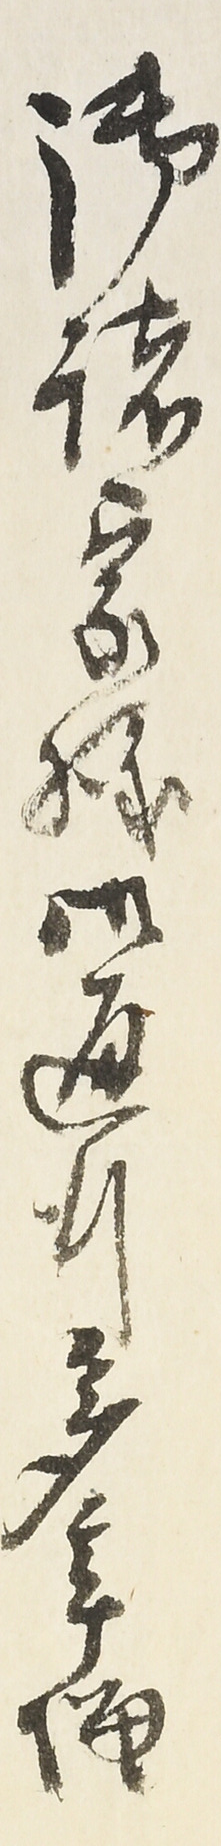御諸家様御通行多年増
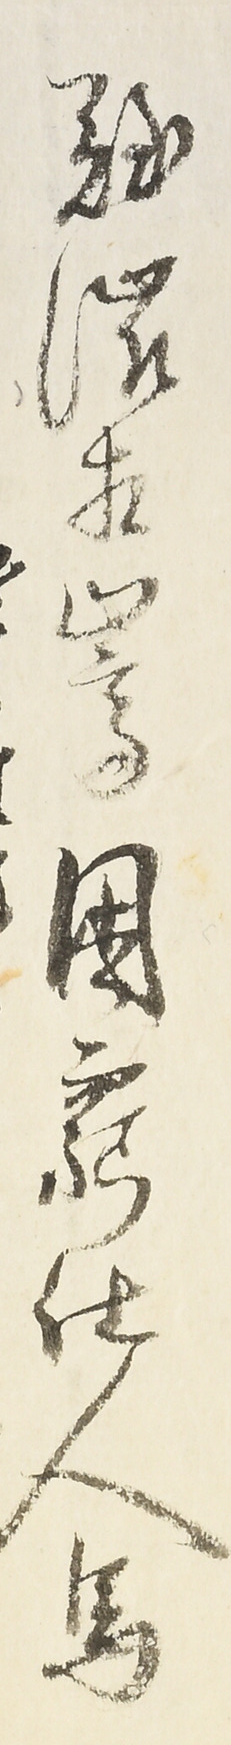難渋相嵩困窮仕人馬
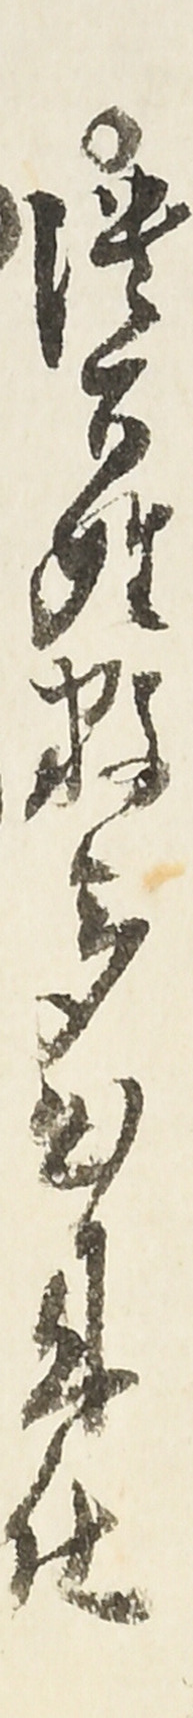〇潰百姓数多出来仕
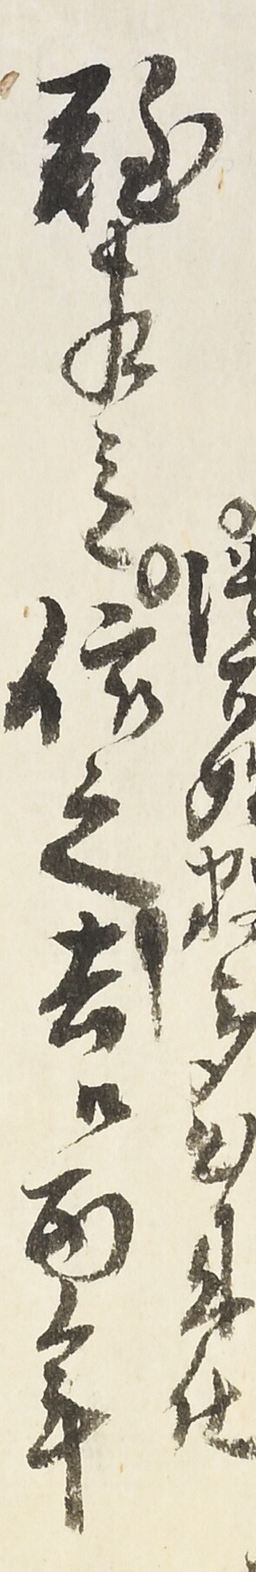難相立〇依之去る酉年
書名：乍恐以書付嘆願奉申上候
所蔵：伊那市立高遠町図書館・合同会社AMANE
